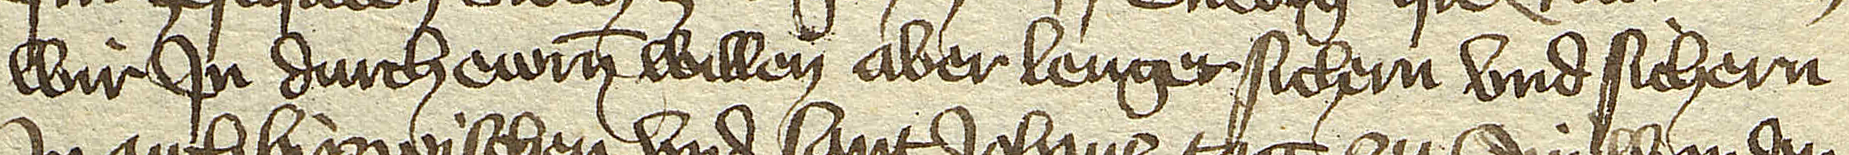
wir In durch ewrn* willen aber lenger ſichern vnd ſichern
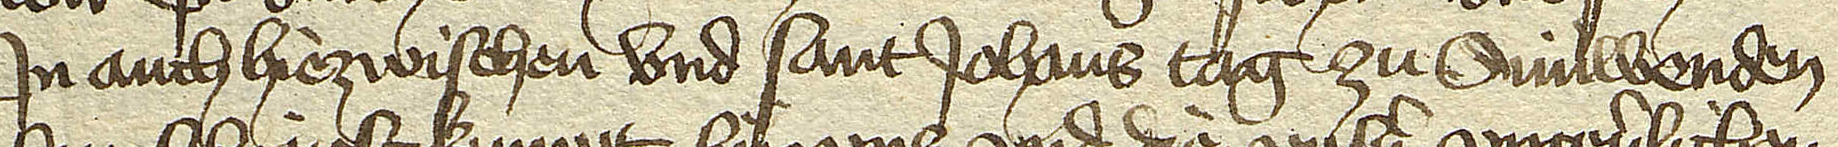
In auch hiecʒwiſchen vnd ſant Iohans tag cʒu Sünwenden
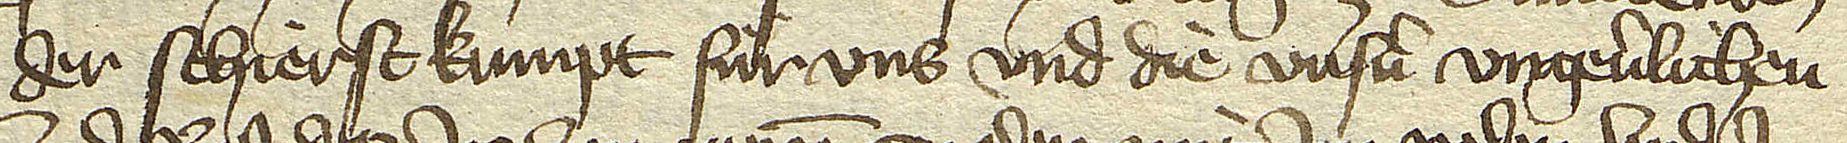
der ſchierſt kumpt für vns vnd die vnſn* vngeu*lichen
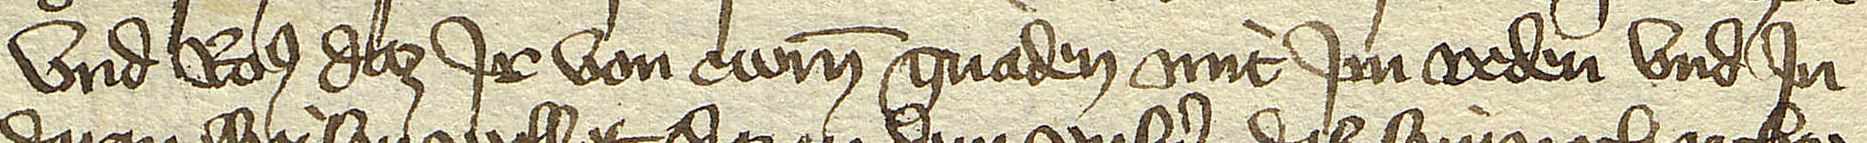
vnd Ro* daʒ Ir von ewrn* gnaden mit Im reden vnd In
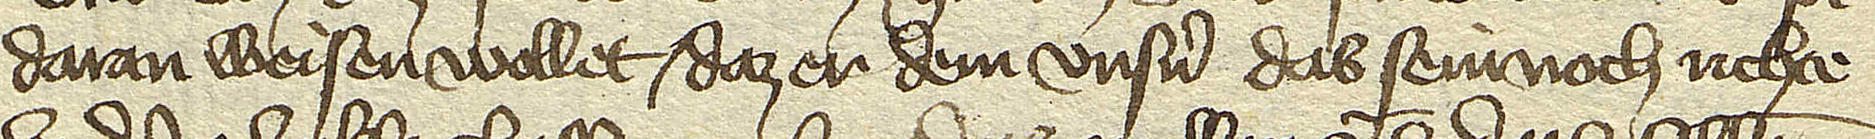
daran weiſen wollet / daʒ er dem vnſn* das ſein noch richte
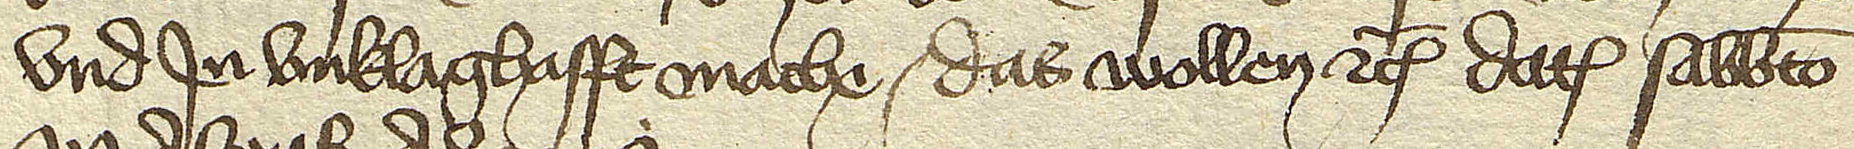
vnd In vnklaghafft mache / das wollen ec* dat* ſabbto*
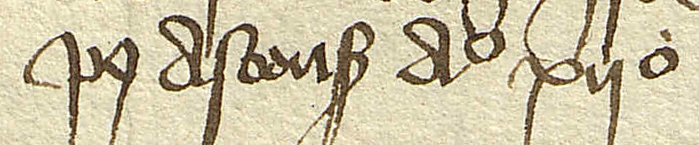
p* Aſcenſ* A* xii*
